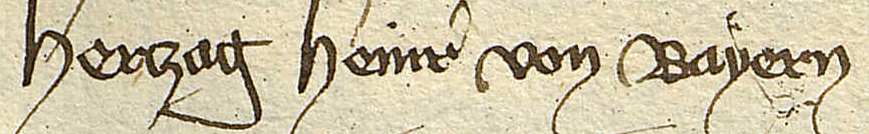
hercʒog heinr* von Bayern
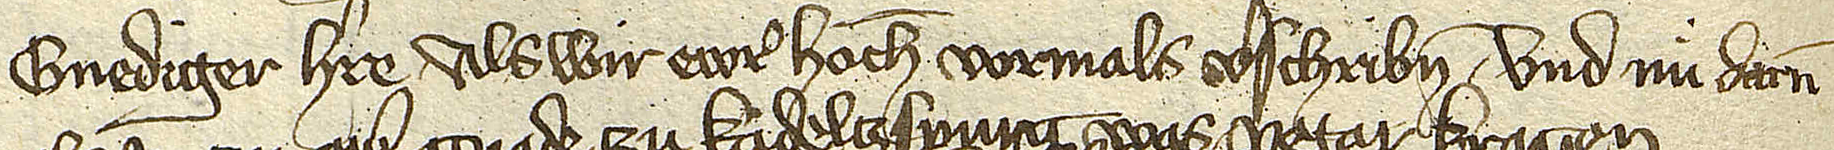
Gnediger h*re / Als wir ewr* hoch* vormals v*ſchribn* / vnd nü dan*
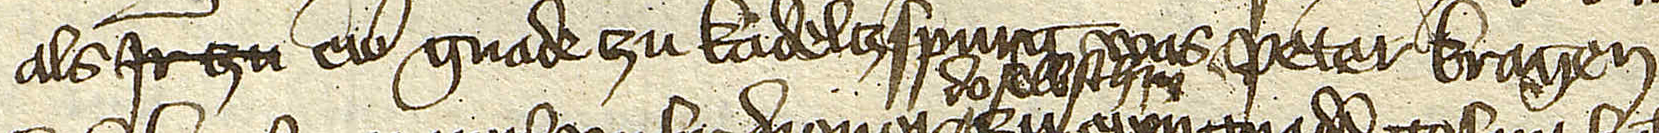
als Ir cʒu ew* gnade cʒu kädelcʒſpurg was Peter Kragen
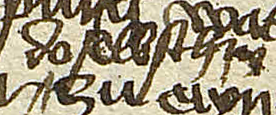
doſelbſthin
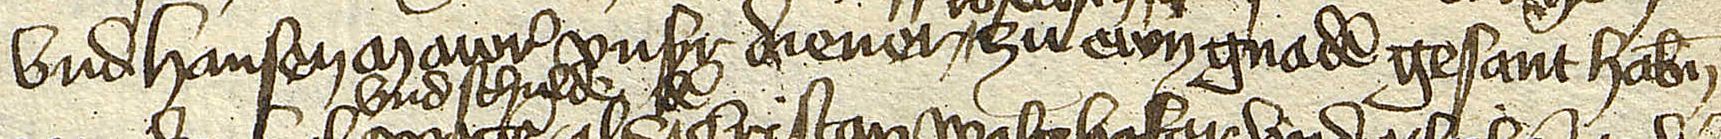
vnd hanſen Mawr* vnſ*r diener cʒu ew*n gnad* geſant habn*
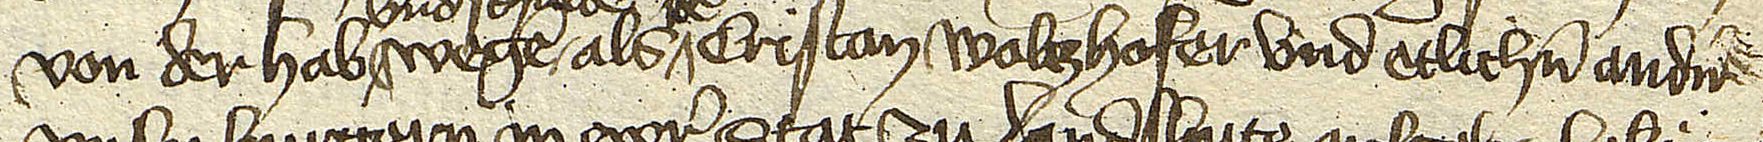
von der hab wege* / als Criſtan wolcʒhofer vnd etlichn* andn*
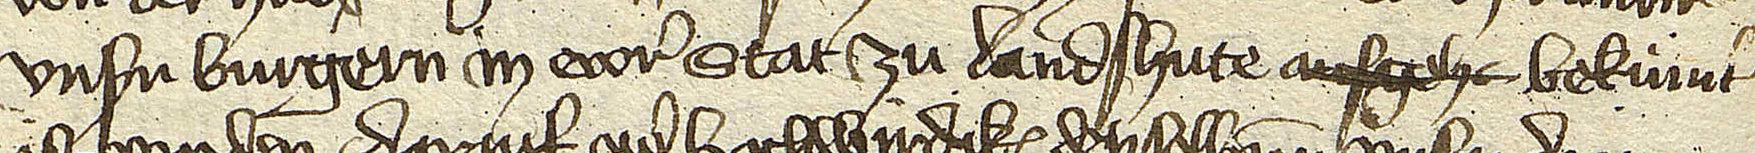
vnſ*n burgern in ewr* Stat cʒu landſhute aufgeh bekümt*
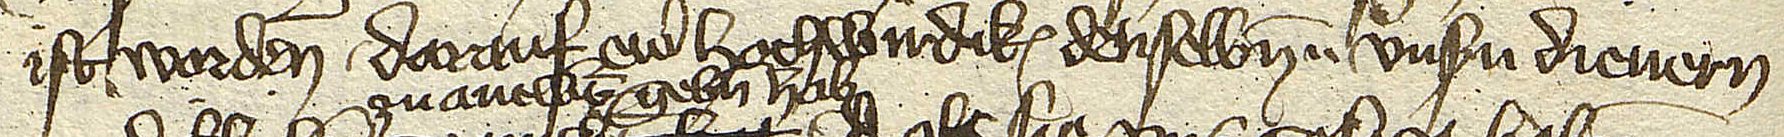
iſt worden / darauf ew* hochwirdik* denſelbn* ~ vnſ*n dienern
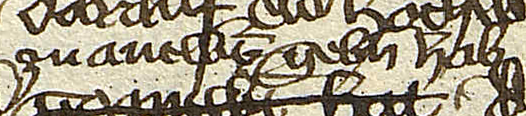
ʒu antw*t gebn* hab
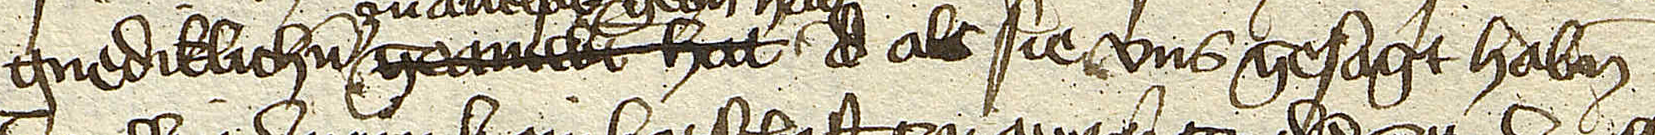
gnediklichn* geantw*t hat / d* als ſie vns geſagt habn*
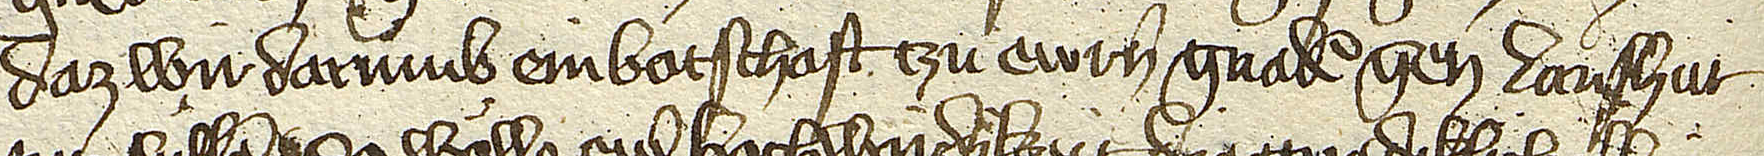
daʒ wir darümb ein botſchaft cʒu ewrn* gnad* gen lanſhut
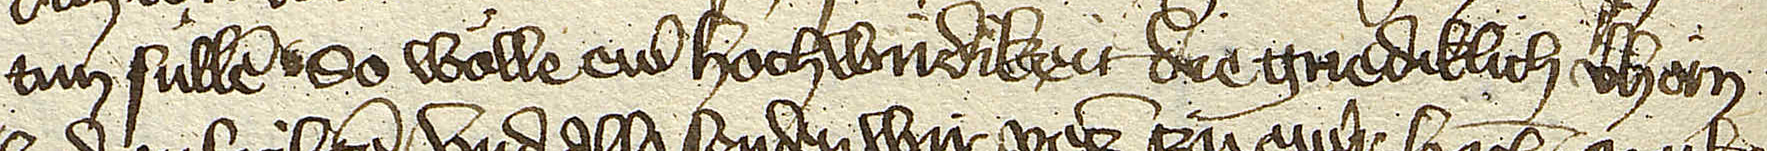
tun ſülle* So wölle ew* hochwirdikeit die gnediklich v*hörn
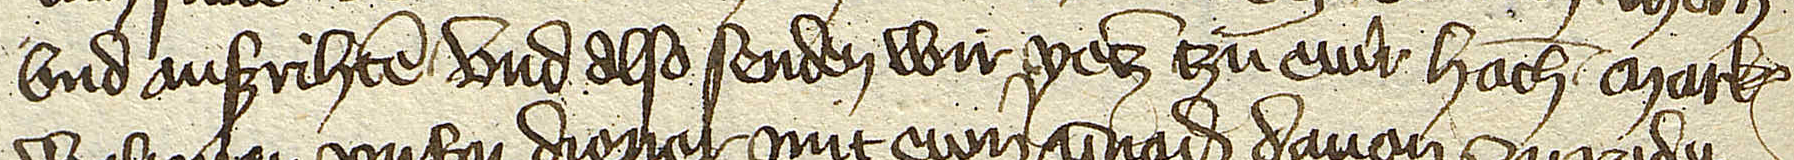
vns auſʒrichte* / vnd alſo ſenden wir yecʒ* cʒu ew*r hoch Mark*
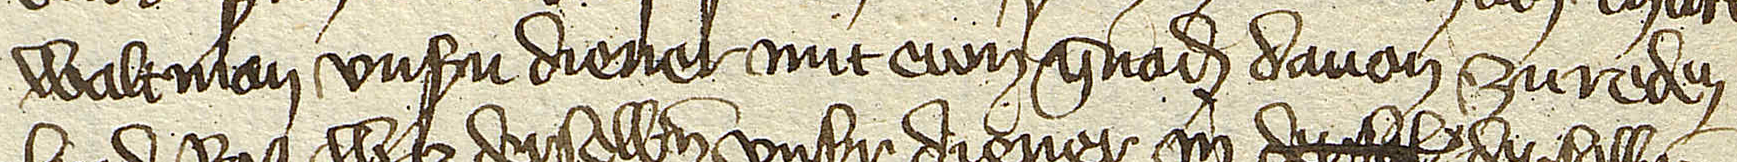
waltman vnſ*n diener mit ewn* gnad* dauon cʒu reden
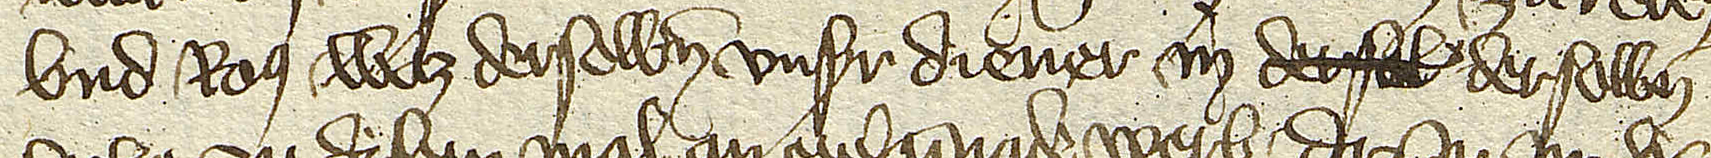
vnd Ro* / waʒ derſelbn* vnſ*r diener in derſel derſelbn*
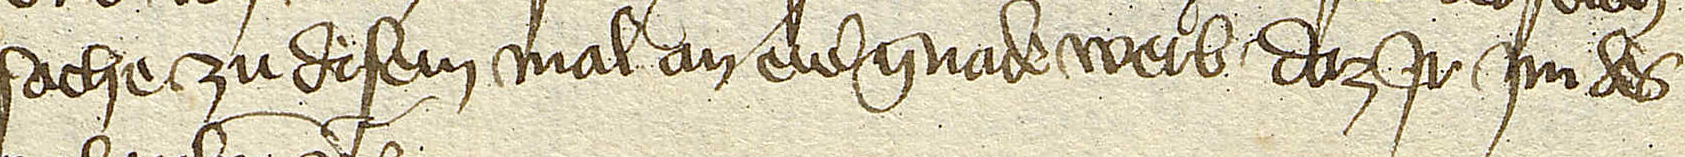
ſache cʒu diſem mal an ew* gnade werb / daʒ Ir Im des
